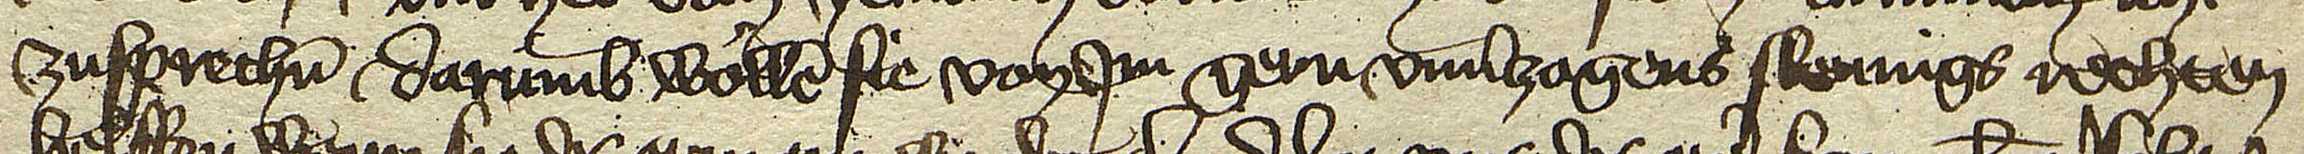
cʒuſprechn* / darümb wölle* ſie von Im gern vnu*cʒogens ſlewnigs rechten
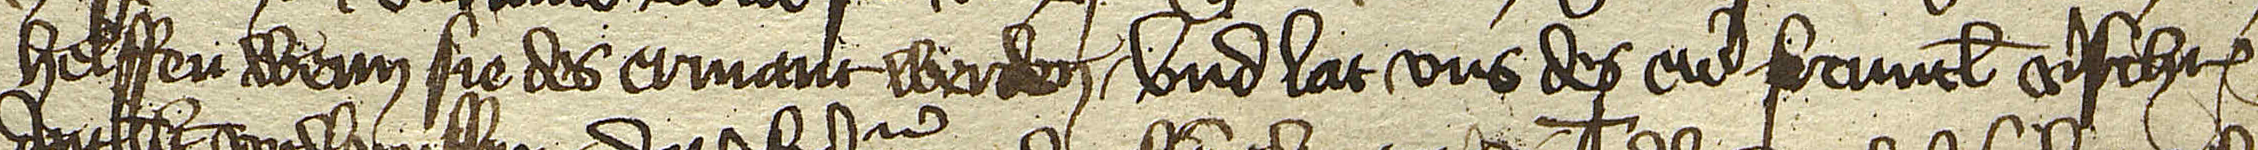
helffen wenn ſie des ermant werden / vnd lat vns des ew* freuntl* v*ſchr*
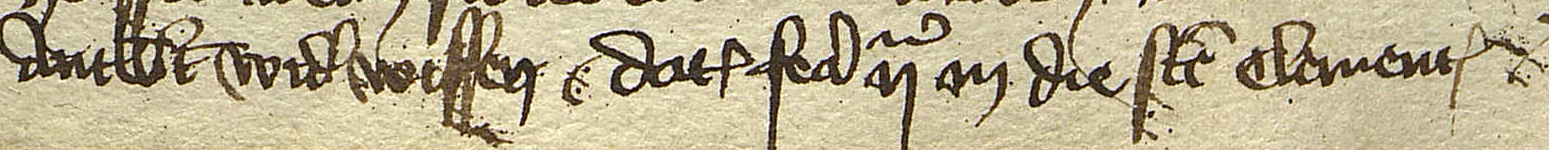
Antwt* wid* wiſſen / dat* fea* ii* an die ſci* Clement* /
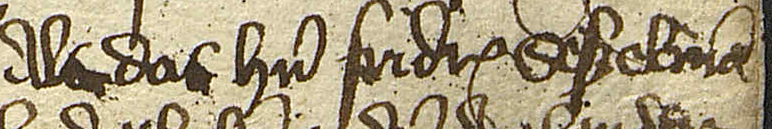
Als das hn* fridr* Seſʒelma*
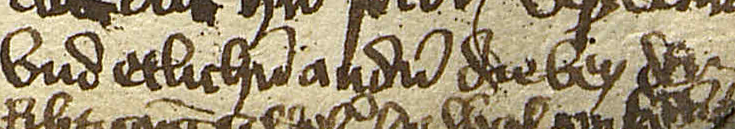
vnd etlichn* andn* die bey der
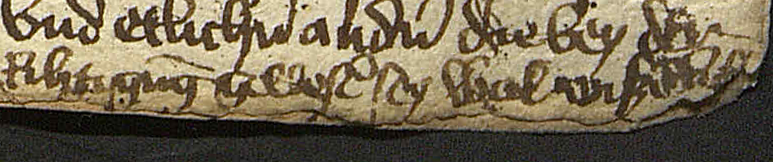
Rihtigug* geweſe* ſey wol wiſʒikl* %%%
